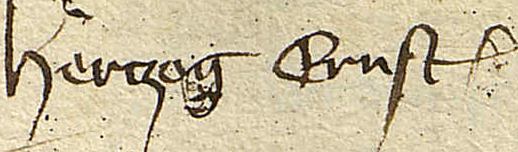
hercʒog Ernſt*
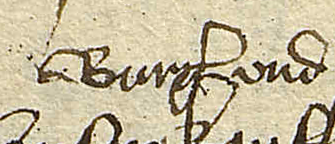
Burg* vnd
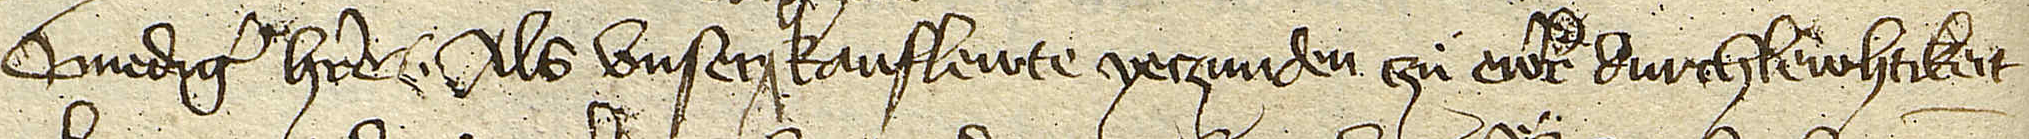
Gnedig* h*re / . Als vnſer kauflewte yecʒunden cʒü ewr* durchlewhtikeit
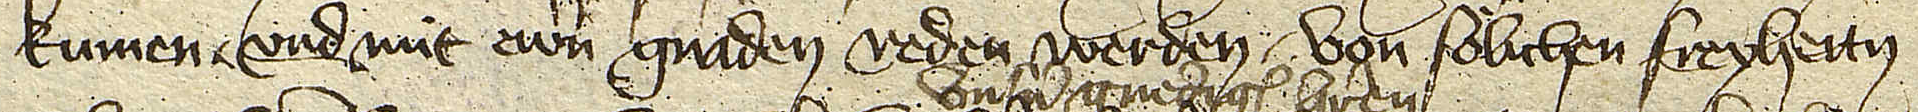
kumen / vnd mit ewn* gnaden reden werden / von ſölichen freyheitn*
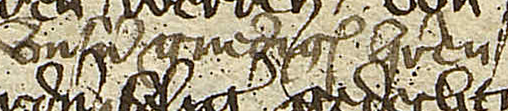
vnſn* gnedig* h*ren
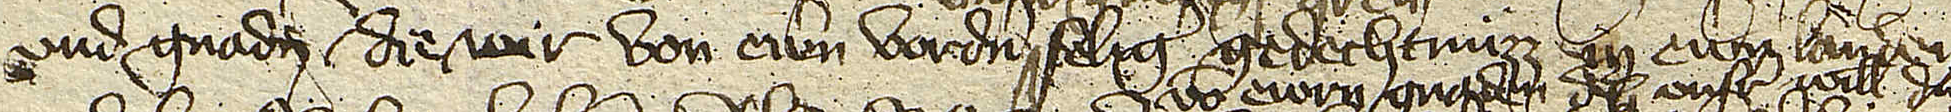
vnd gnadn* / die wir von ewn* vordn* ſelig gedechtnüʒʒ in ew*n landen
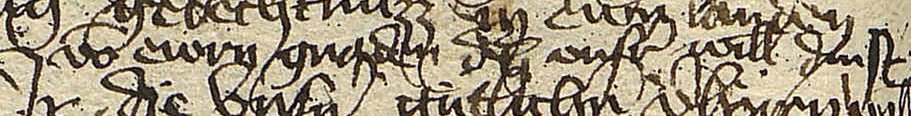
vo* ewrn gnaden dh* vnſr* will* dinſt
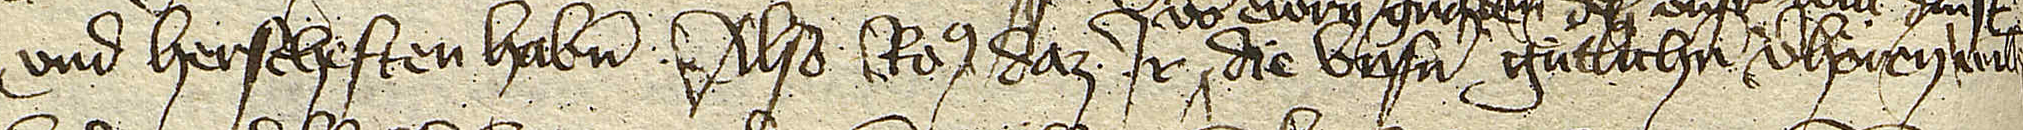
vnd herſcheften habn* . Alſo Ro* daʒ Ir die vnſn* gütlichn* v*hören %%%%
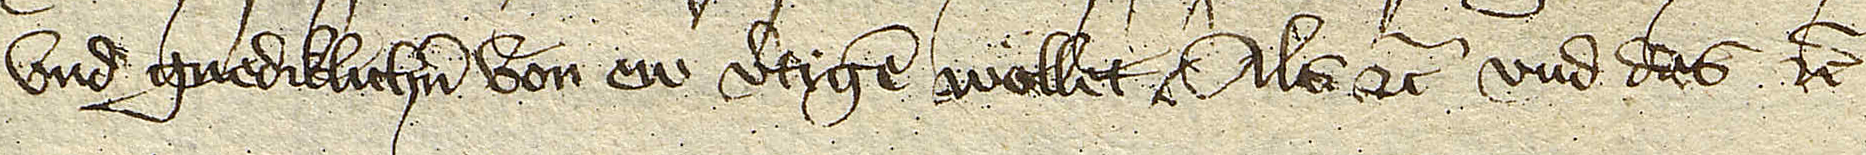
vnd gnediklichn* von ew v*tige* wöllet / Als ec* vnd das ec*
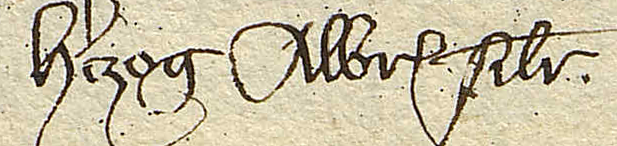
h*cʒog Albr* ſilr* .
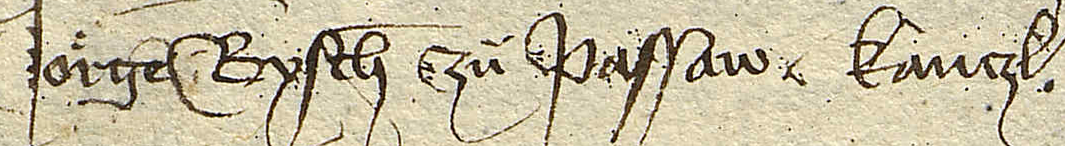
Iörge* Byſch* cʒü Paſſaw / kancʒl*
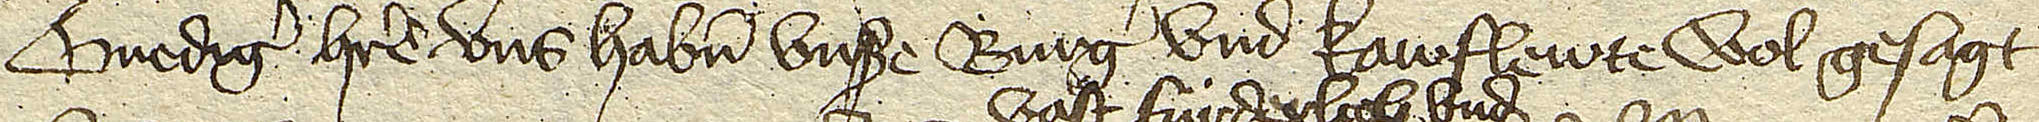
Gnedig* hr*e / vns habn* vnſ*e Burg* vnd kawflewte wol geſagt
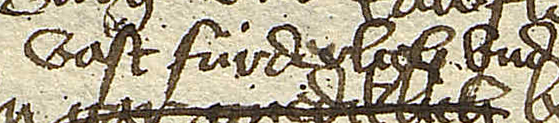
vaſt fürderlich vnd
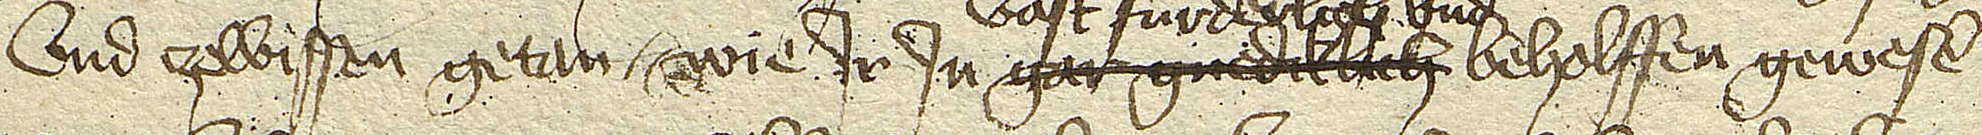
vnd cʒewiſſen getan / wie Ir In gar gnediklich beholffen geweſe*
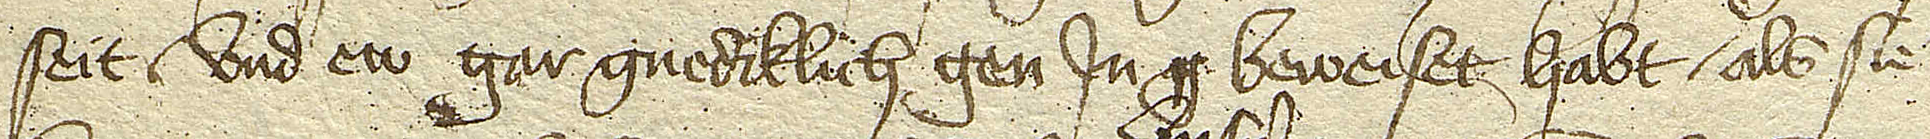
ſeit / vnd ew gar gnediklich gen In g beweiſet habt / als ſie
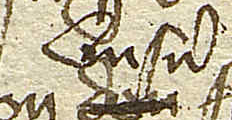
vnſn*
